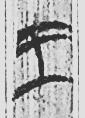王
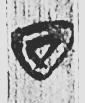回
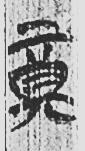奠
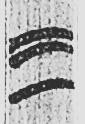三
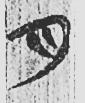月
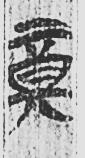奠
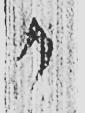人
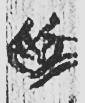爲
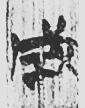成
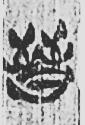晉
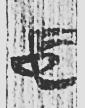𠁩
